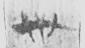卅
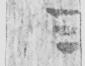三
